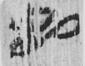厽（三）
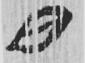日
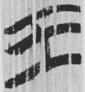王
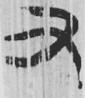又（有）
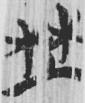埜（野）
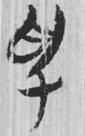色
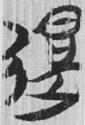逗
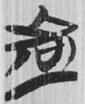者
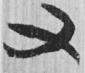又（有）
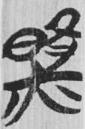○（暍）
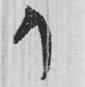人
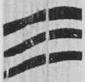三
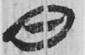日
